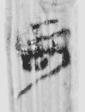可
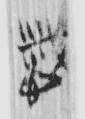慼
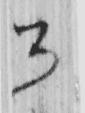乃
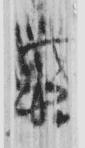慼
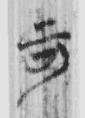可
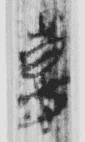𢝫
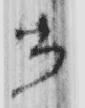乃
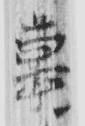𢝫
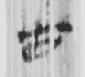古
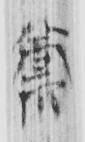常
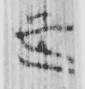正
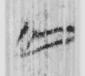亡
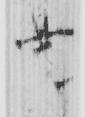弋
